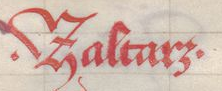.Zaltarz.
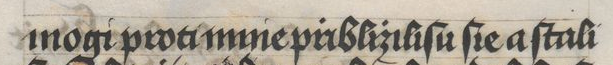mogi proti mnie pṙibližiliſu ſie a ſtali
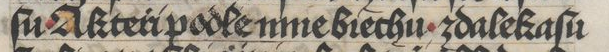ſu.A kteṙí podle mnie bíechu.zdalekaſu
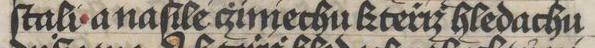ſtali.a naſilé cžiníechu kteṙíż hledachu
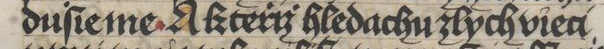duẛie me.A kteṙíż hledachu zlych viecí
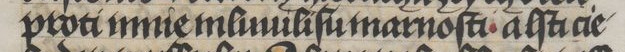proti mnie mluuiliſu marnoſti.a lſti cie¬
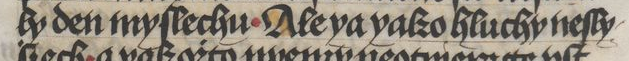ly den myſlechu.Ale ya yako hluchy neſly¬
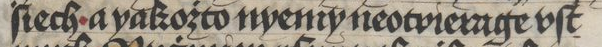ẛiech.a yakożto nyemy neotvierage vſt
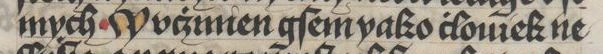mych.Y vcżnien gſem yako ċlouíek ne
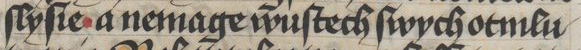ſlyẛie.a nemage wuſtech ſwych otmlu¬
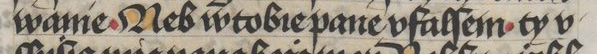waníe.Neb w tobie pane vfalſem.ty v¬
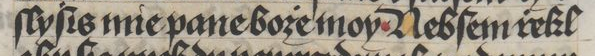ſlyẛis mie pane boże moy.Nebſem ṙekl
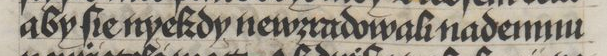aby ſie nyekdy newzradowali nademnu
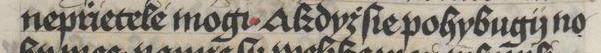nepṙietelé mogi.akdyż ſie pohybugij no¬
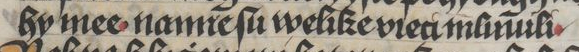hy mee.namieſu welike vieci mluuili.
